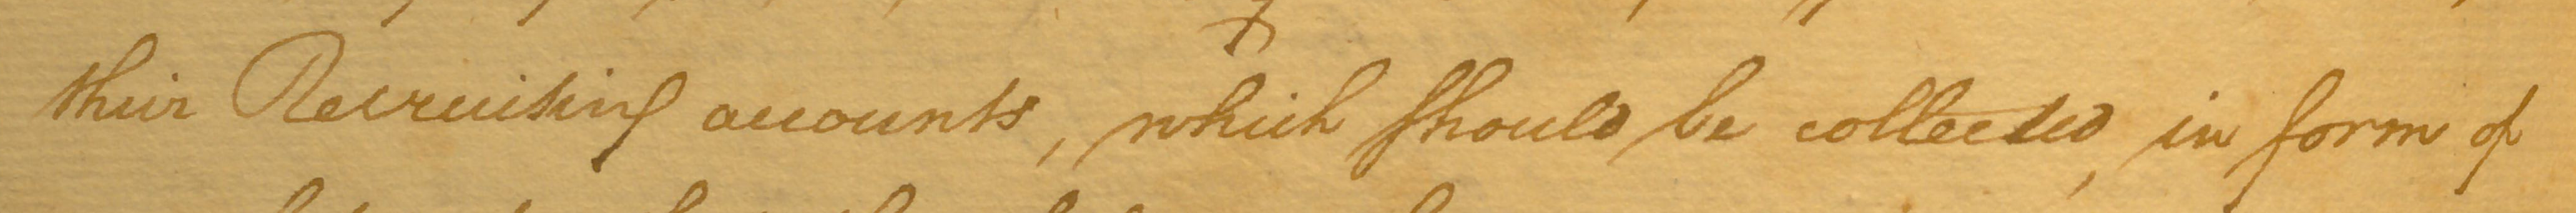their Recruiting accounts, which should be collected in form of
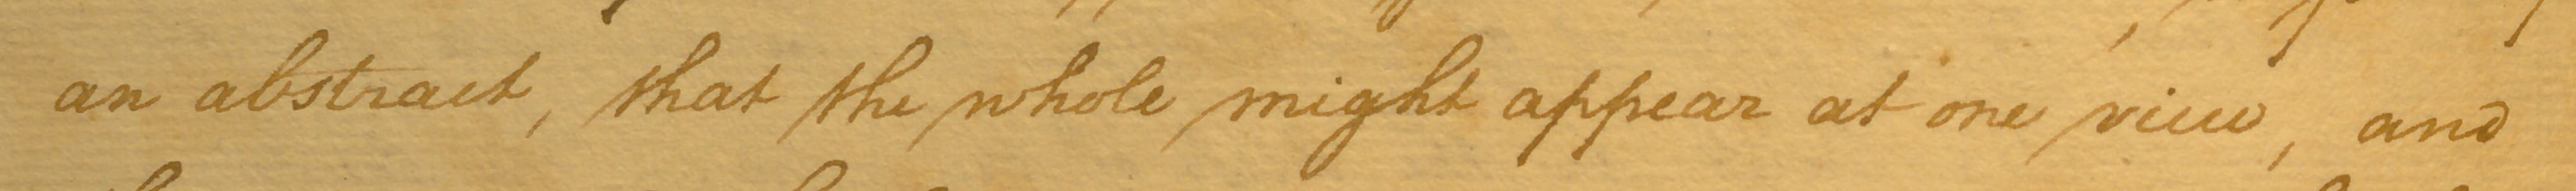an abstract, that the whole might appear at one view, and
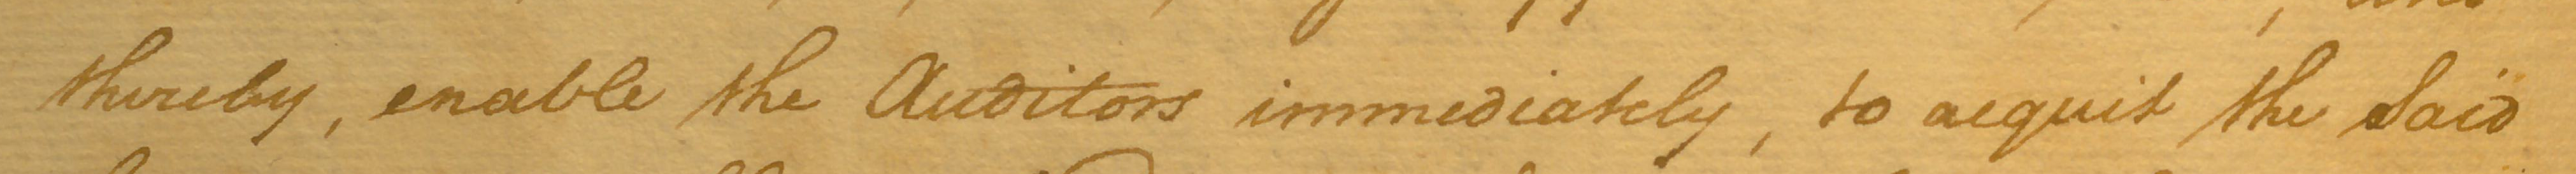thereby enable the Auditors immediately, to acquit the Said
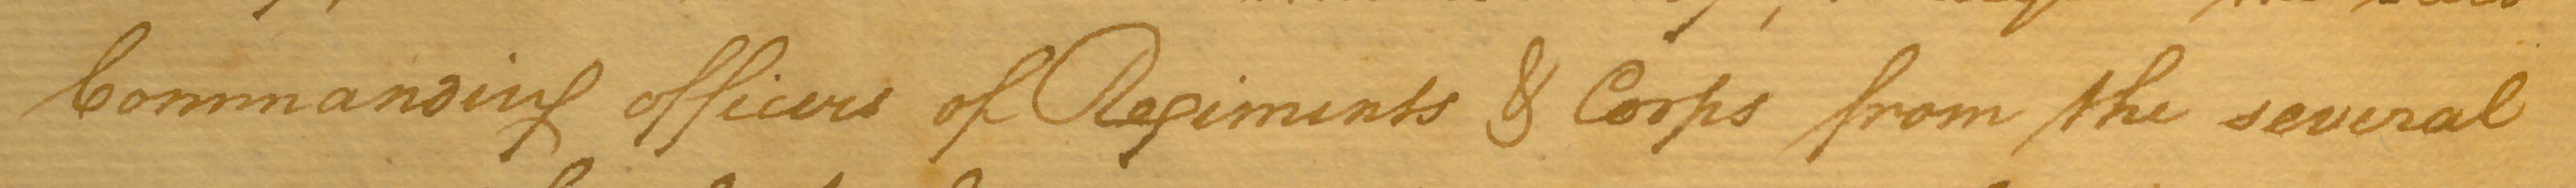Commanding officers of Regiments & Corps from the several
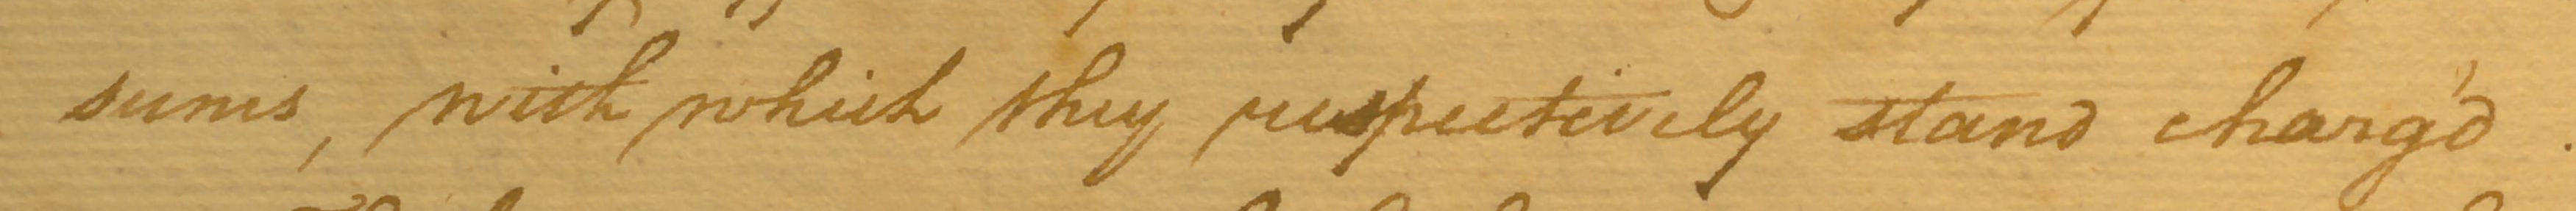sums, with which they respectively stand charg'd
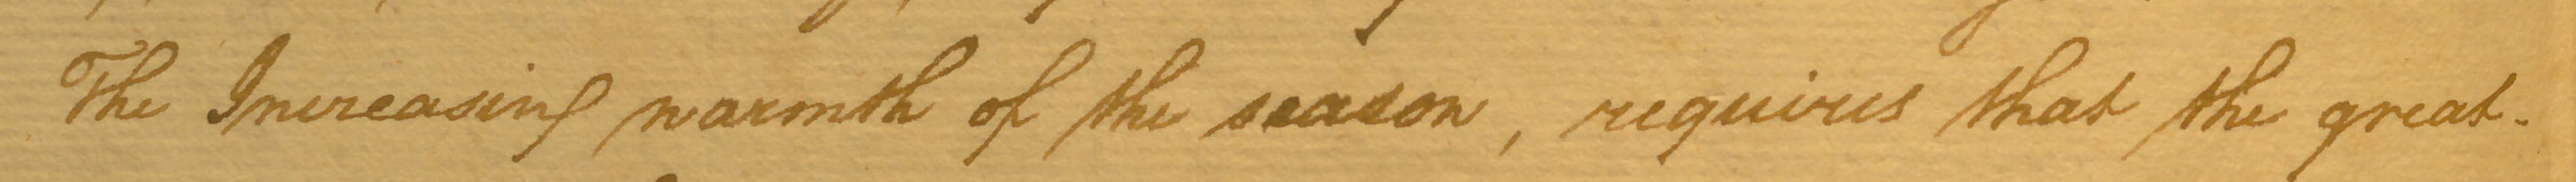the Increasing warmth of the season, requires that the great-
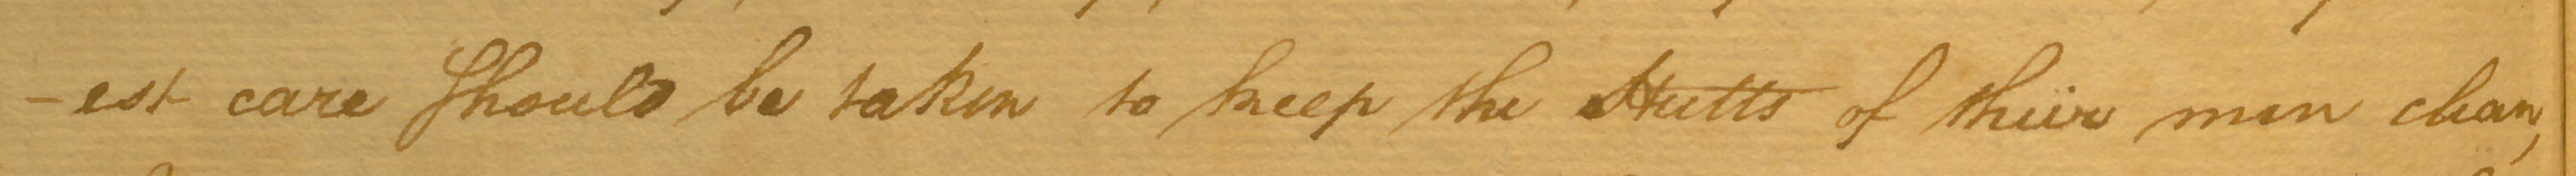-est care should be taken to keep the Hutts of their men clean,
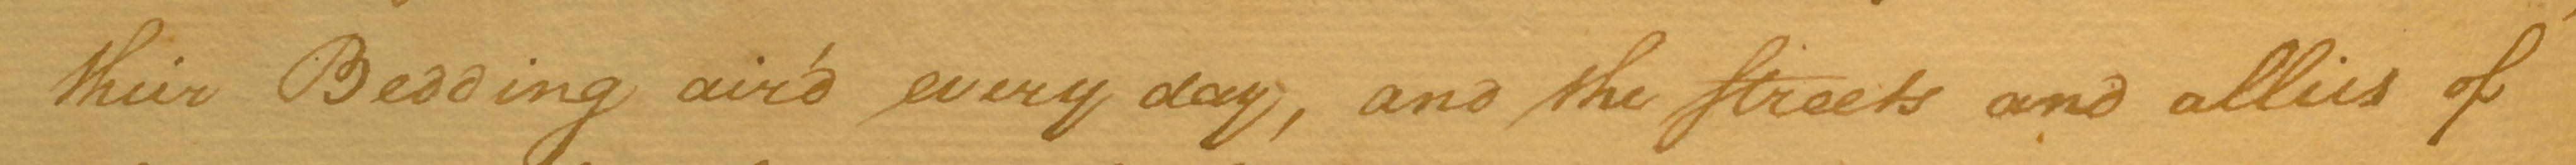their Bedding air'd every day, and the streets and allies of the
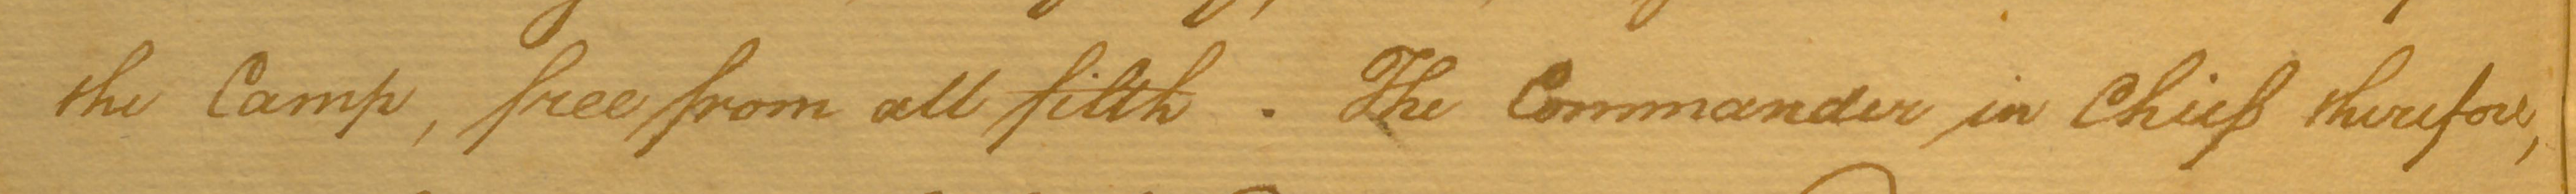the Camp, free from all filth. The Commander in Chief therefore,
